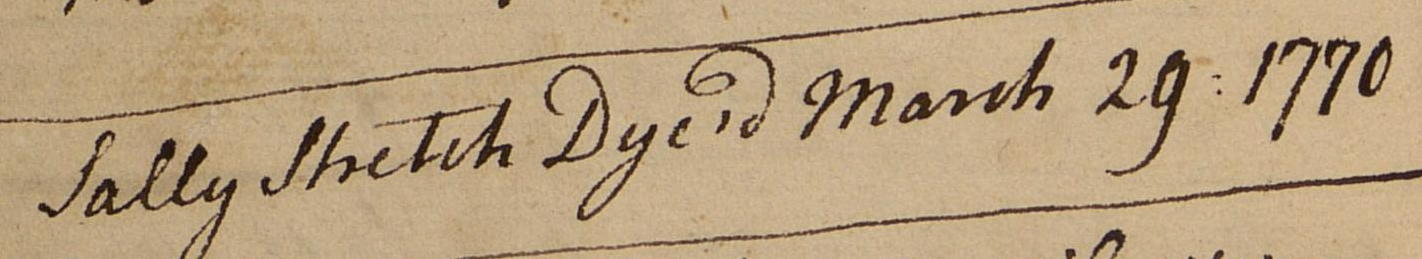Sally S[h]etch Dye'd March 29 1770
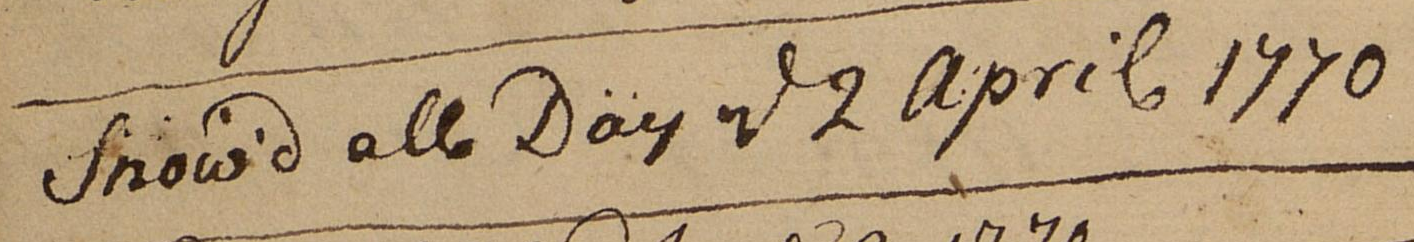Snow'd all Day y^e 2 April 1770
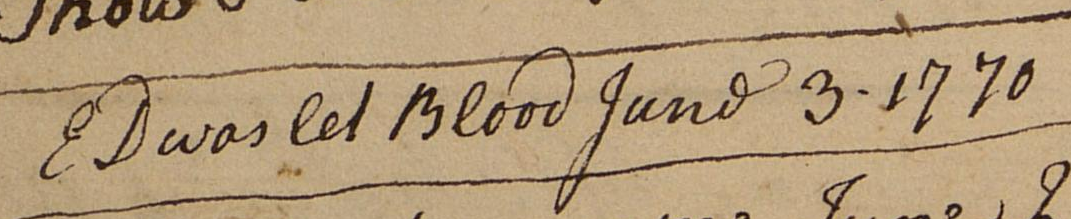ED was let Blood June 3-1770
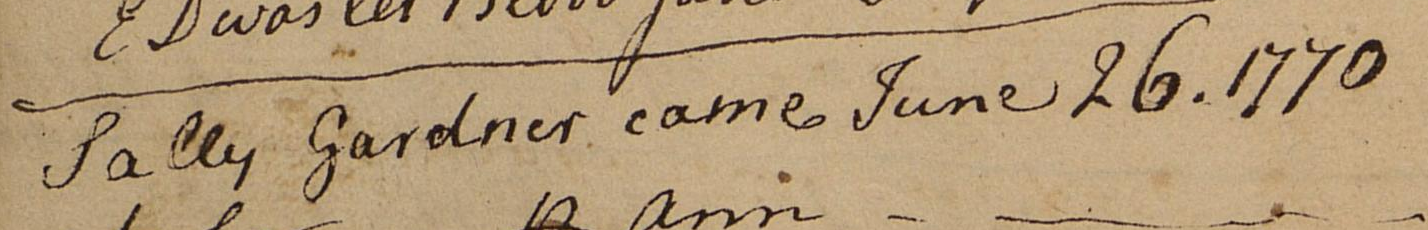Sally Gardner came June 26. 1770
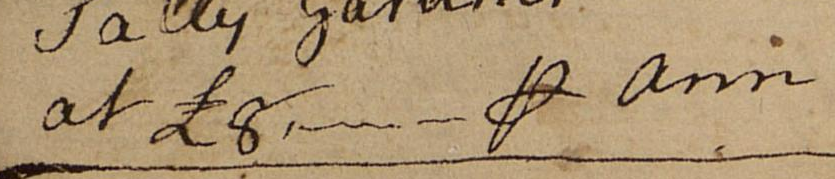at 8 sterlings - per Ann
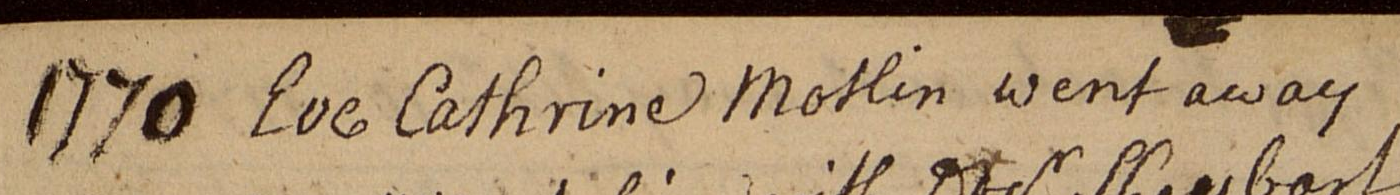1770 Eve Cathrine Motlin went away
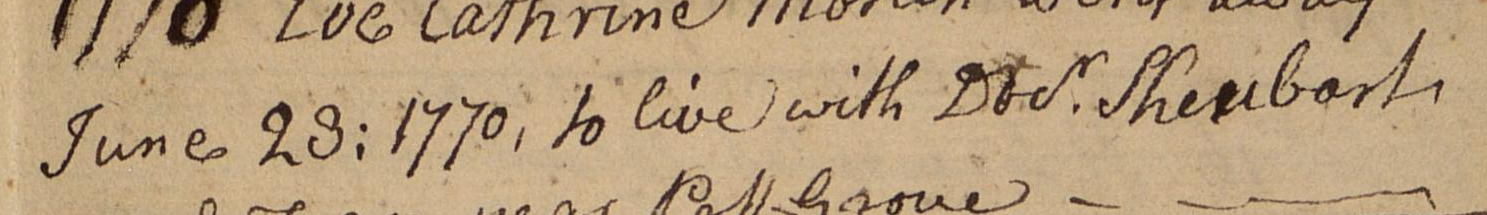June 23: 1770, to live with Doc^r Sheubort
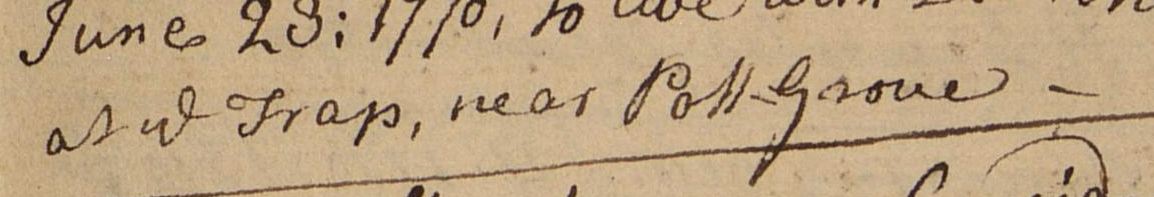at y^e [Frap], near Pott-Grove-
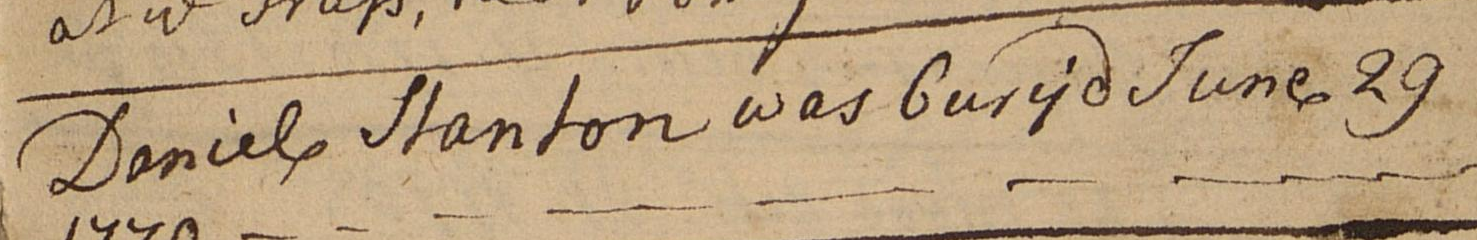Daniel Stanton was bury'd June 29
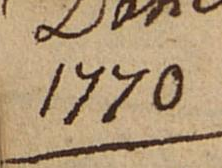1770-
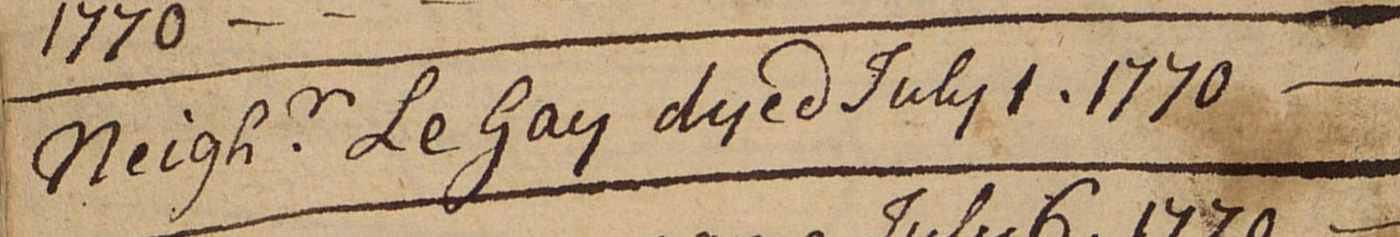Neigh^r LeGay dyed July 1, 1770 -
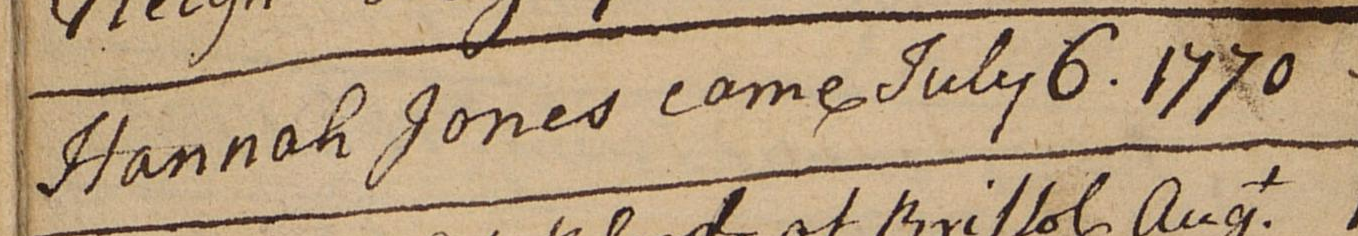Hannah Jones came July 6. 1770 -
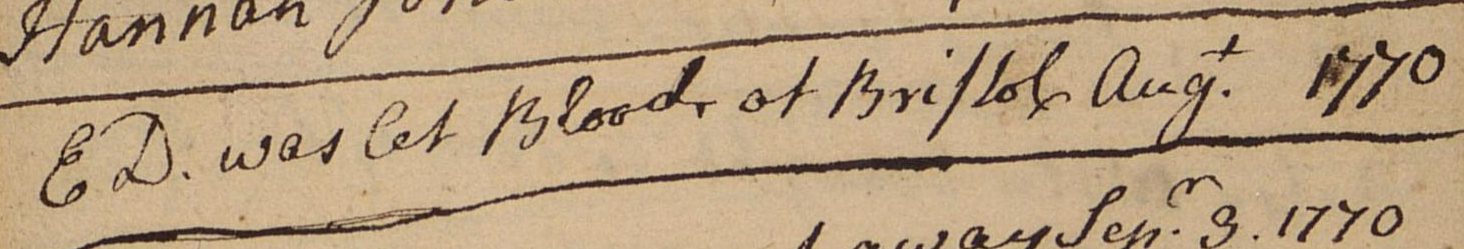ED. was let Blood at Bristol Aug^t 1770
